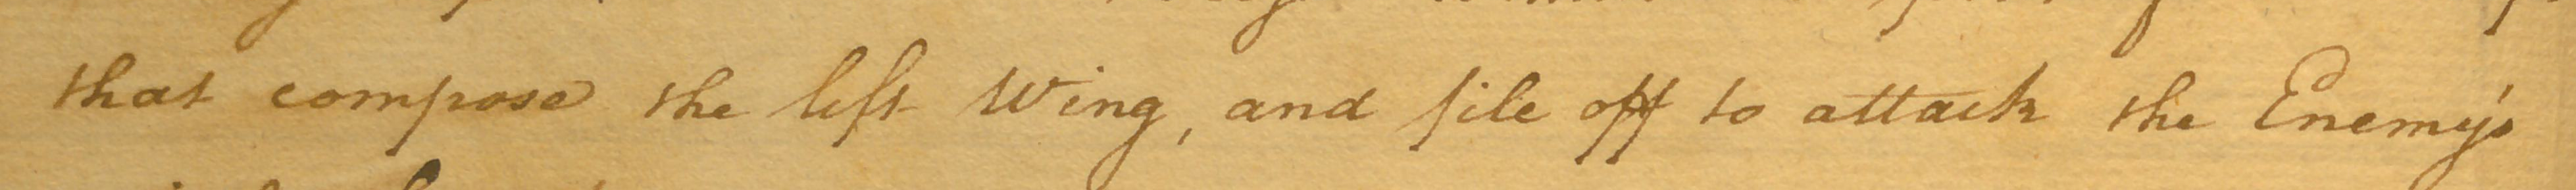that compose the left Wing, and file off to attack the Enemy's
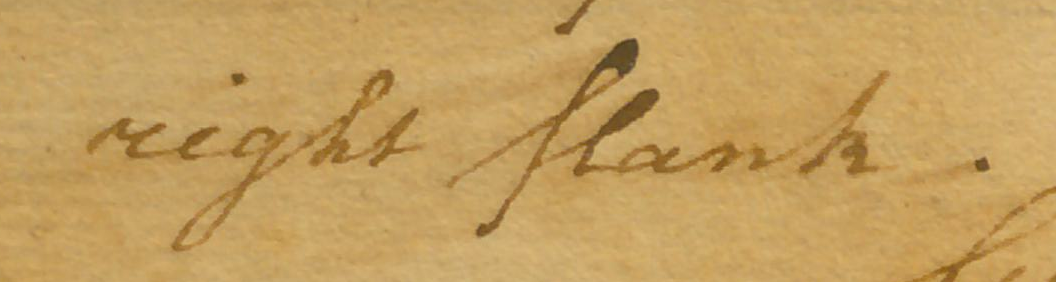right flank.
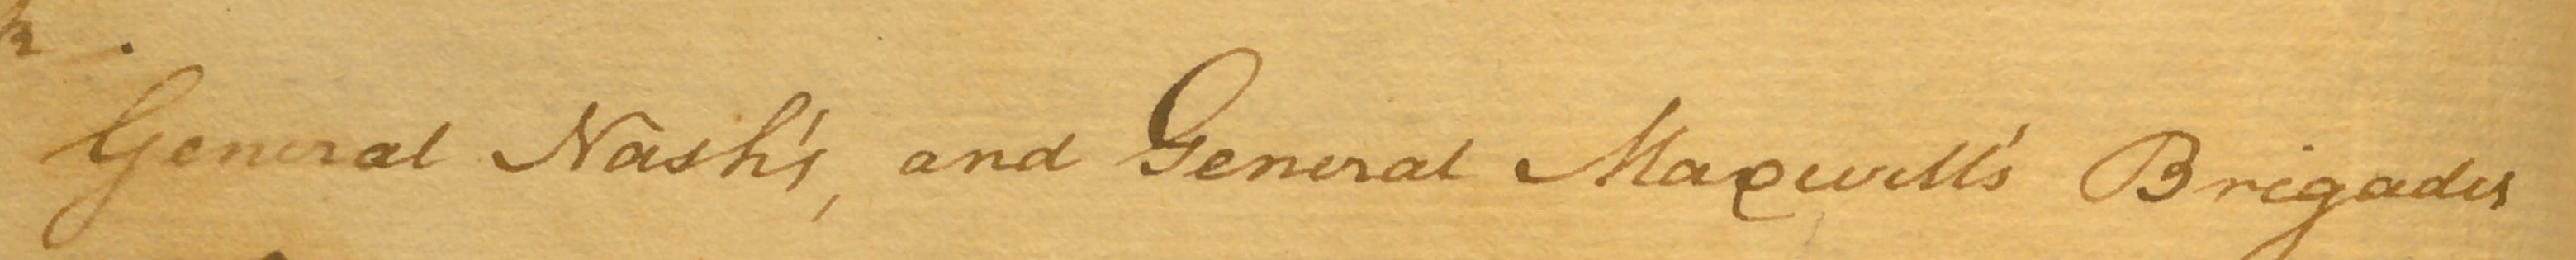General Nash's and General Maxwell's Brigades
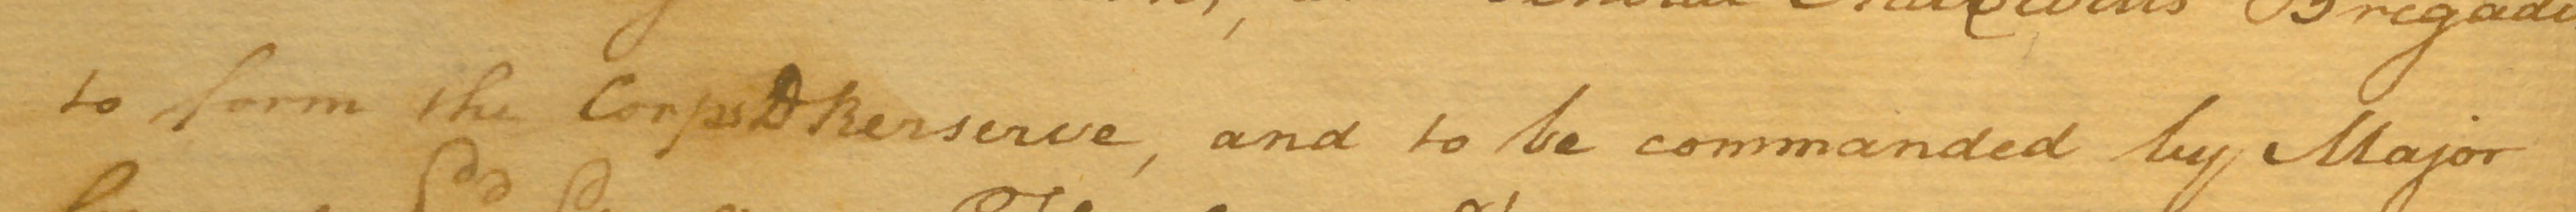to form the Corps D Rerserve and to be commanded by Major
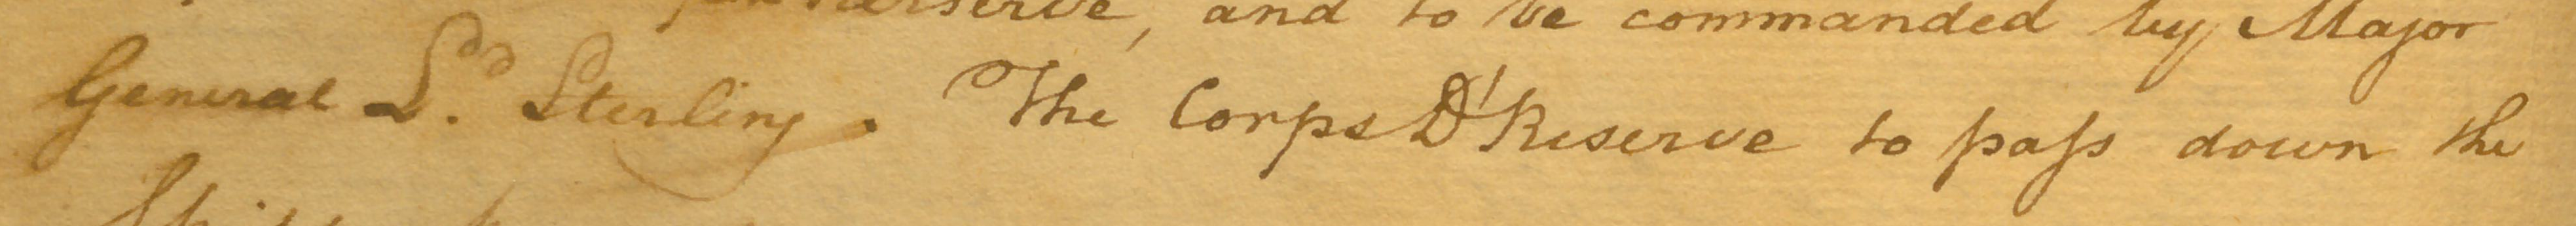General L^d. Sterling. The Corps D'Reserve to pass down the
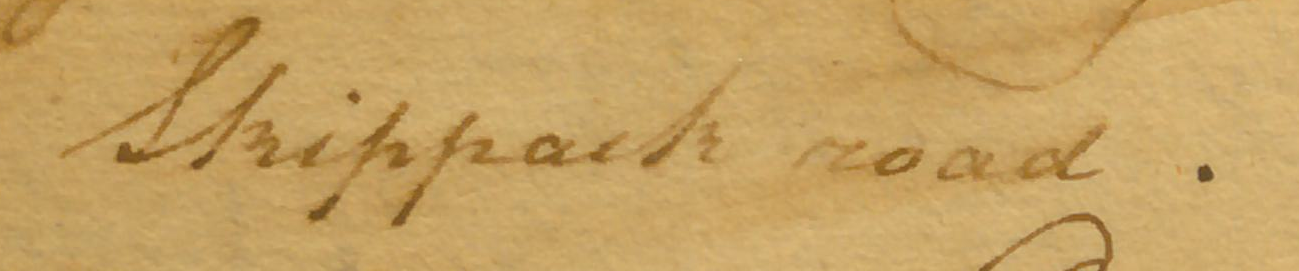Skippack road.
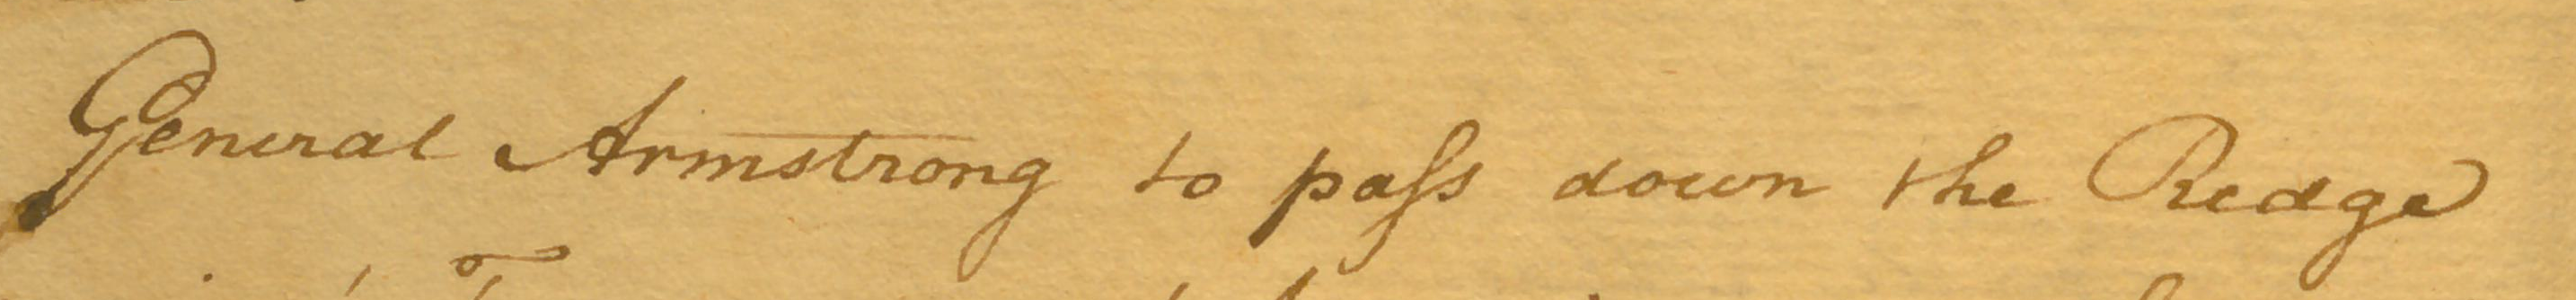General Armstrong to pass down the Ridge
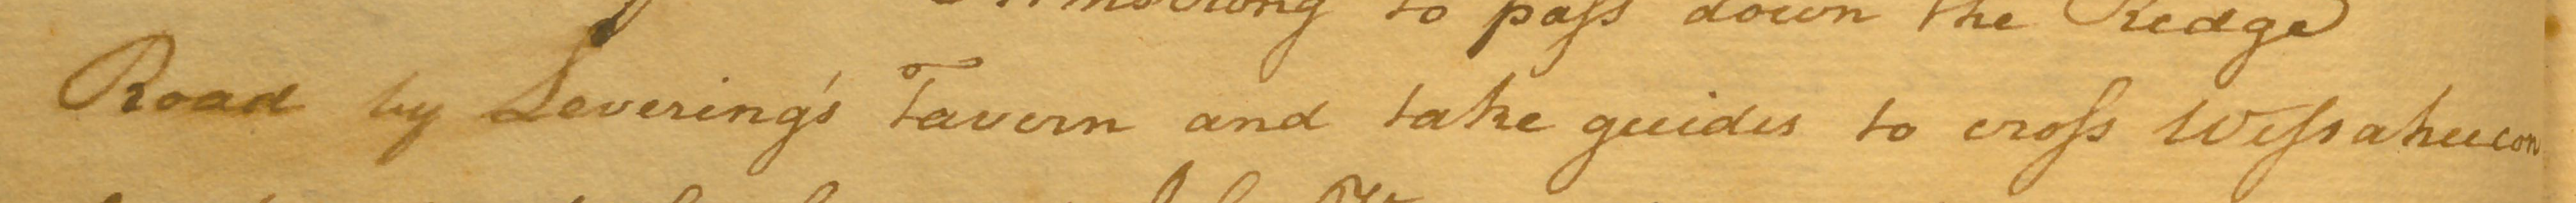Road by Severing's Tavern and take guides to cross Wissaheecon
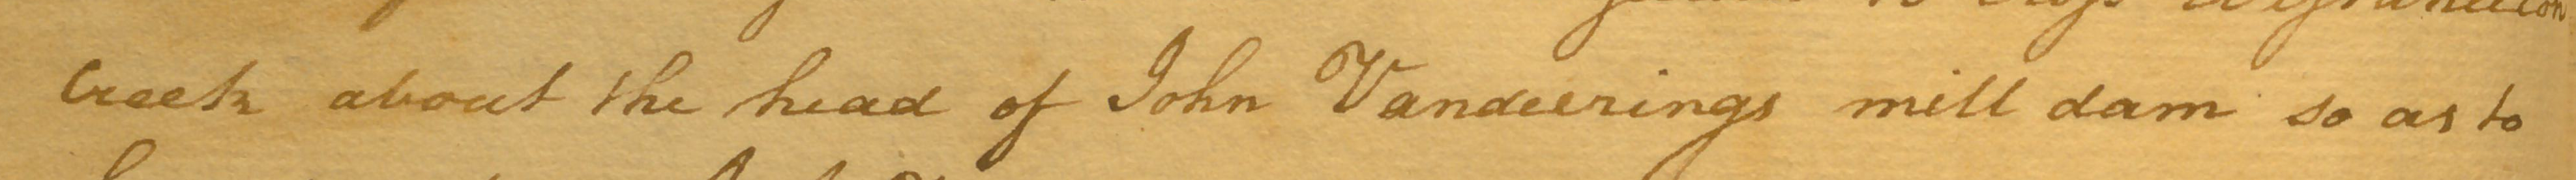Creek about the head of John Vandeerings mill dam so as to
